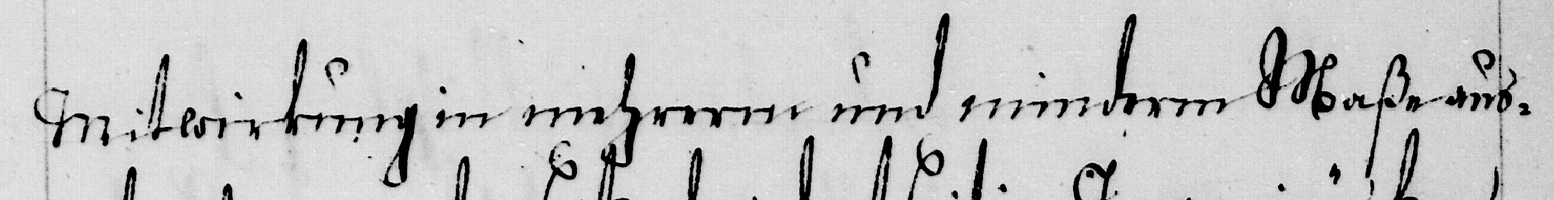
Mitwirkung in mehrerm und minderm Maße aus¬
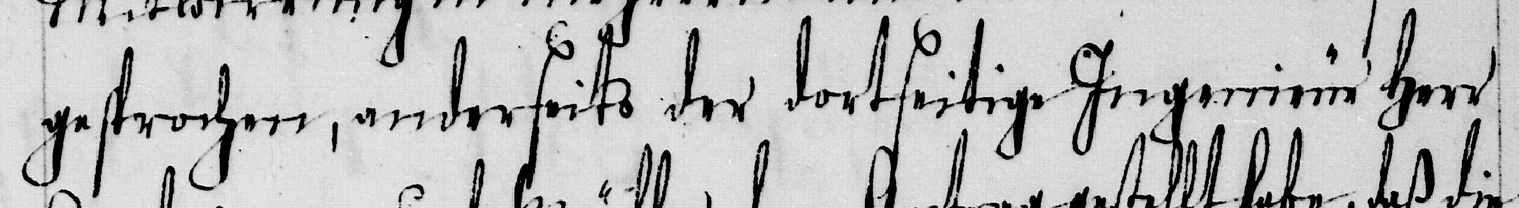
gesprochen, anderseits der dortseitige Ingenieur Herr
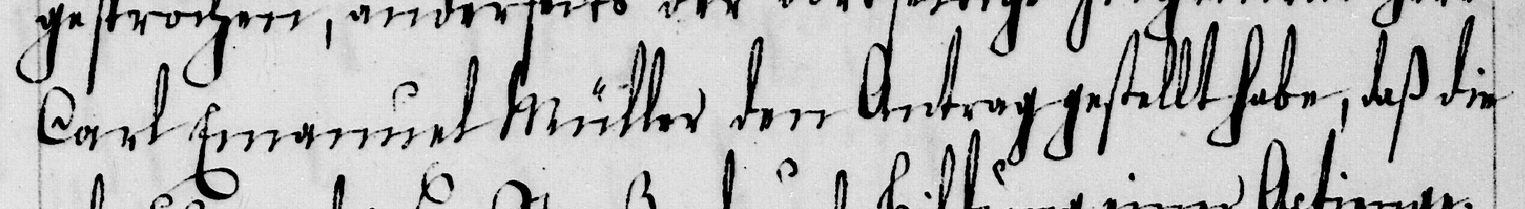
Carl Emanuel Müller den Antrag gestellt habe, daß
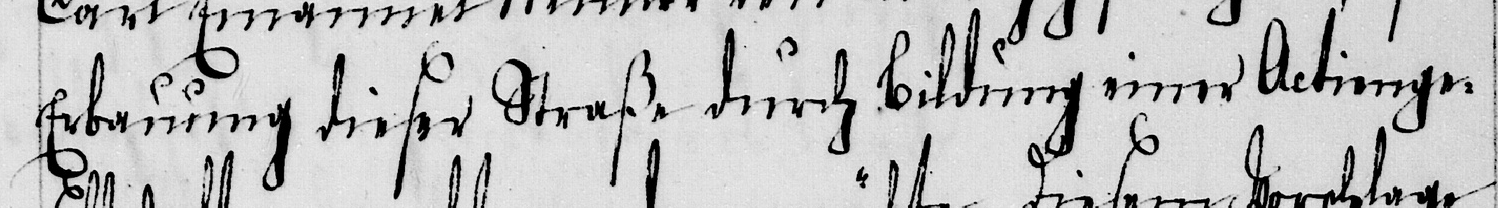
Erbauung dieser Straße durch Bildung einer Actienges¬
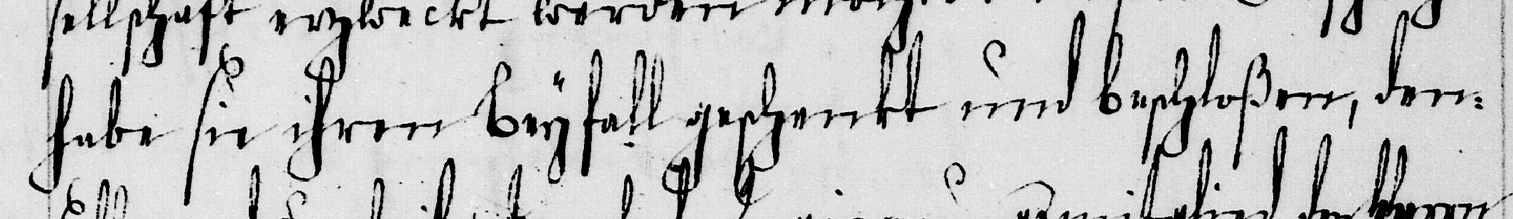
habe sie ihren Beyfall geschenkt und beschloßen, den¬
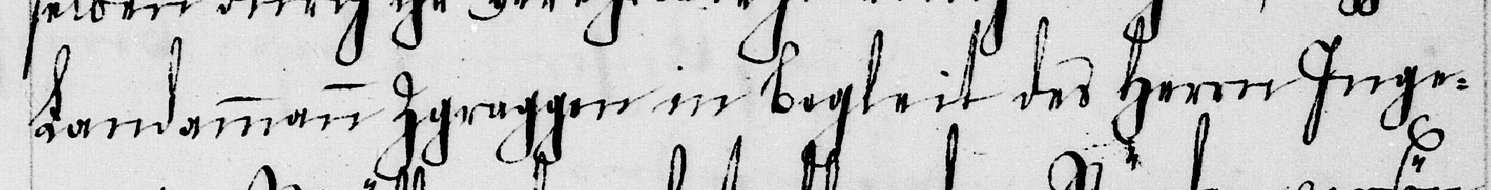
Landammann Zgraggen in Begleit des Herrn Inge¬
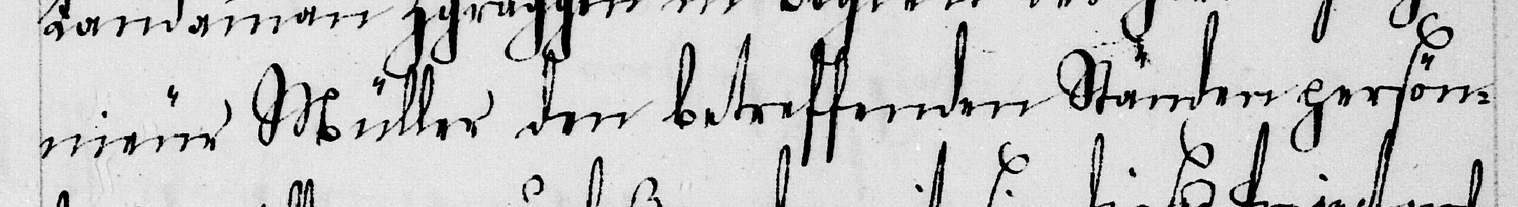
nieur Müller den betreffenden Ständen persön¬
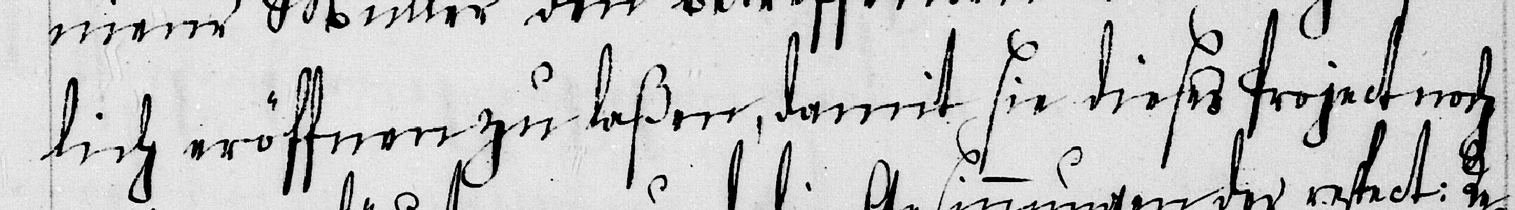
lich eröffnen zu laßen, damit sie dieses Project n¬
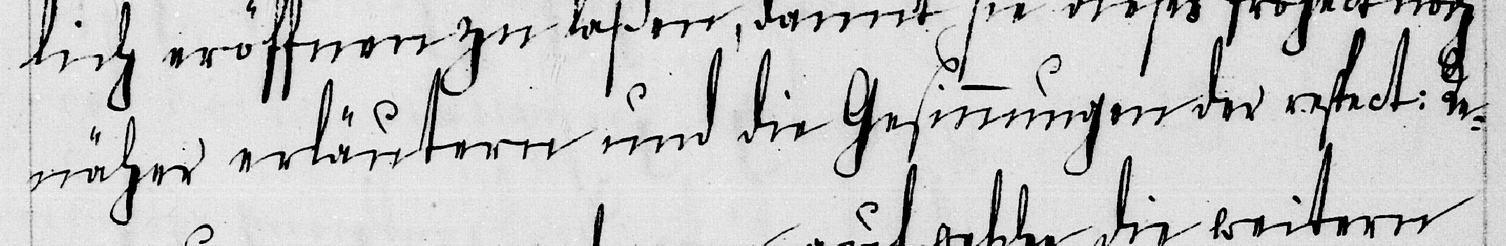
näher erläutern und die Gesinnung der respect: R¬
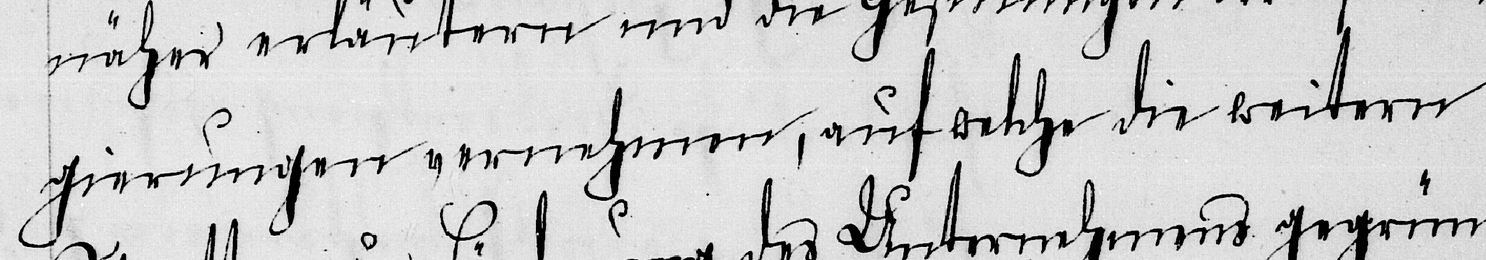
egierungen vernehmen, auf welche die weitern
